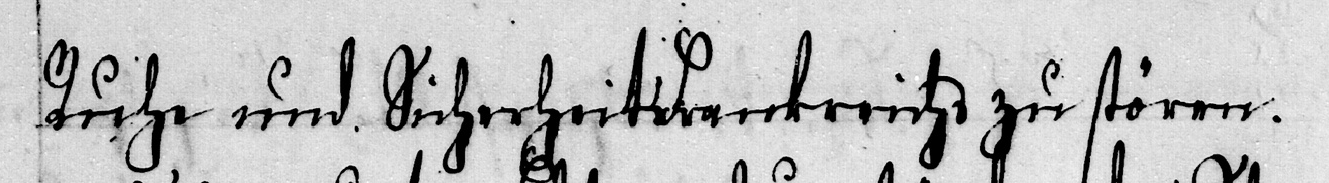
Ruhe und Sicherheit Frankreichs zu stören.
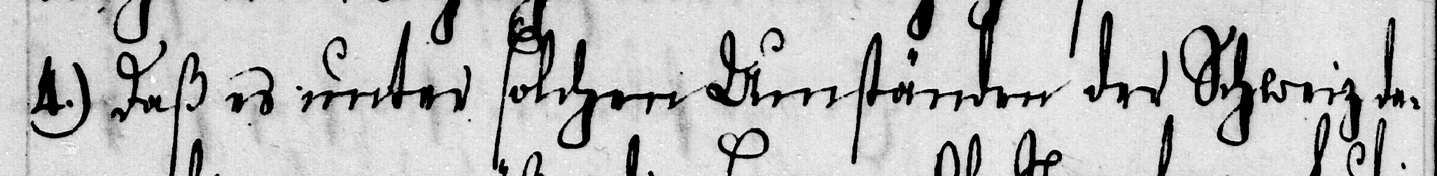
4.) Daß es unter solchen Umständen der Schweiz d¬
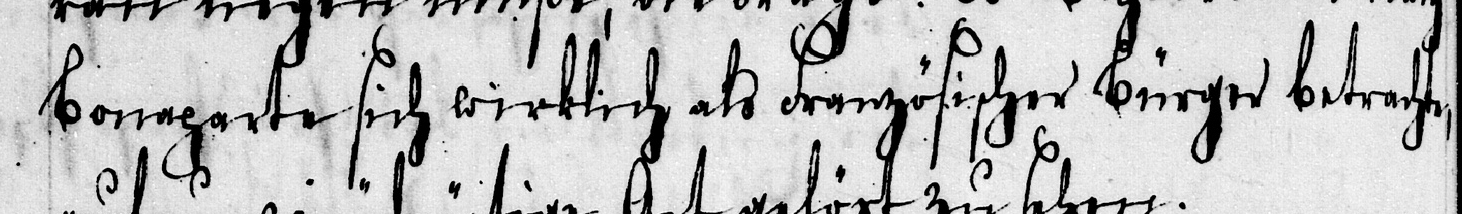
Bonaparte sich wirklich als Französischer Bürger betr¬
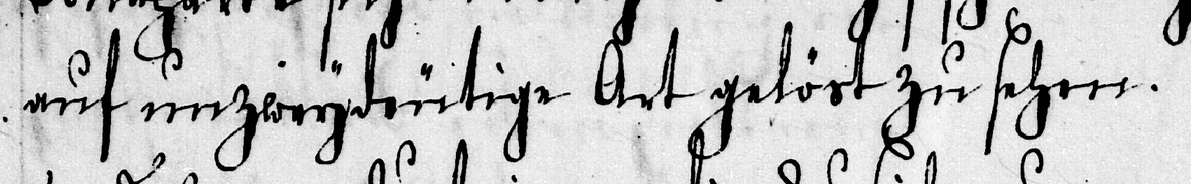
auf unzweydeutige Art gelöst zu sehen.
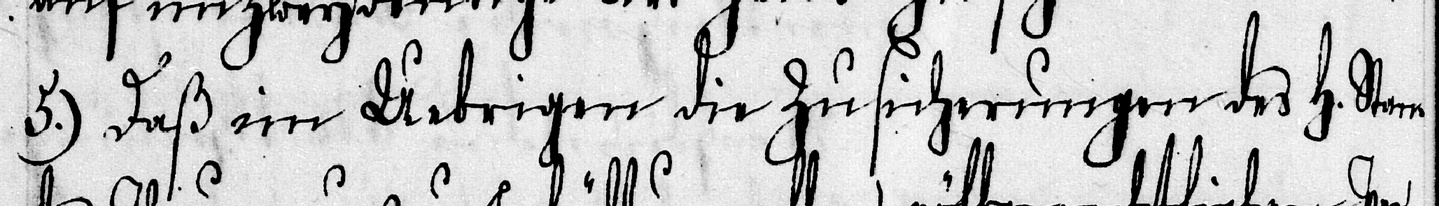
5.) Daß im Uebrigen die Zusicherungen des H. Sta¬
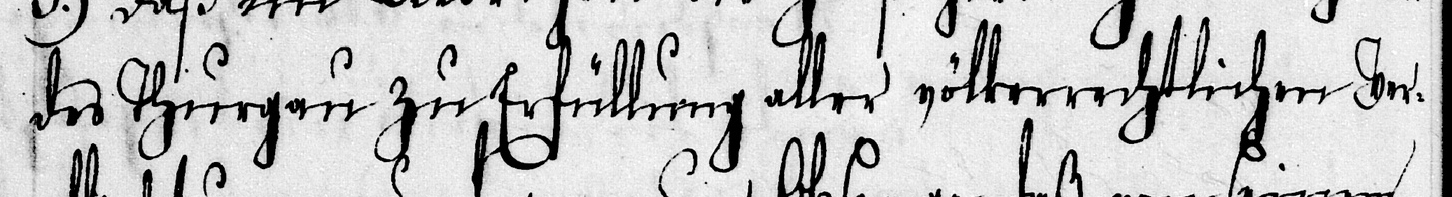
ndes Thurgau zu Erfüllung aller völkerrechtlichen Ver¬
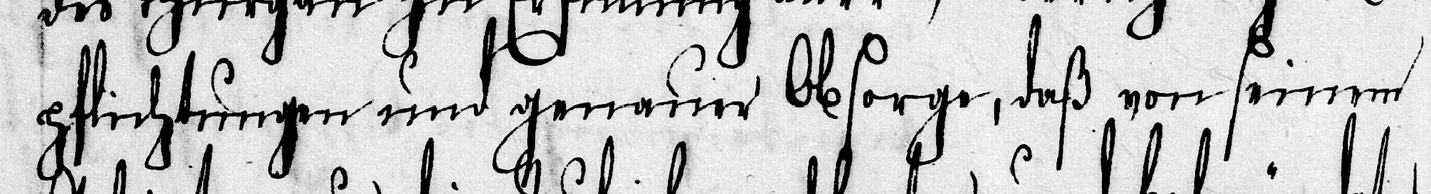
pflichtungen und genauer Absorge, daß von seinem
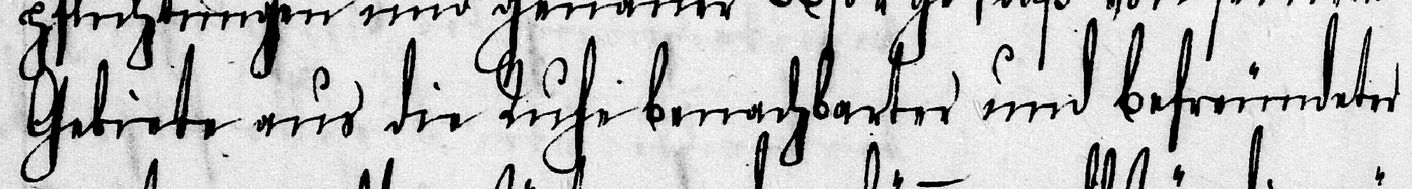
Gebiete aus die Ruhe benachbarter und befreundeter
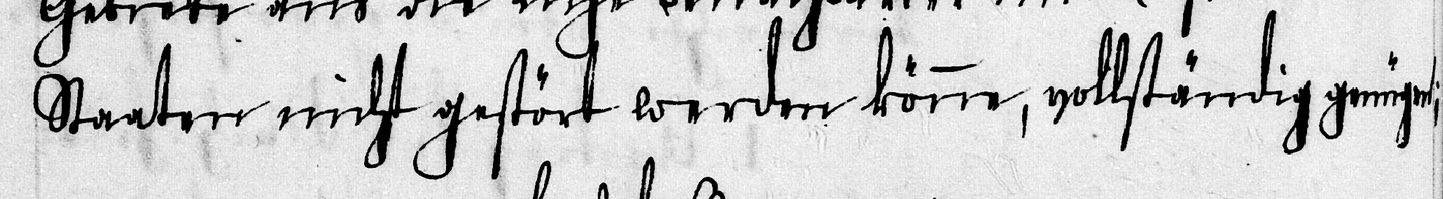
Staaten nicht gestört werden könne, vollständig genüg¬
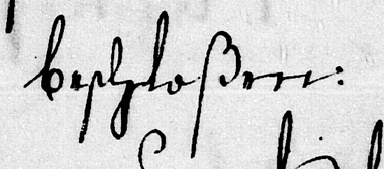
beschloßen:
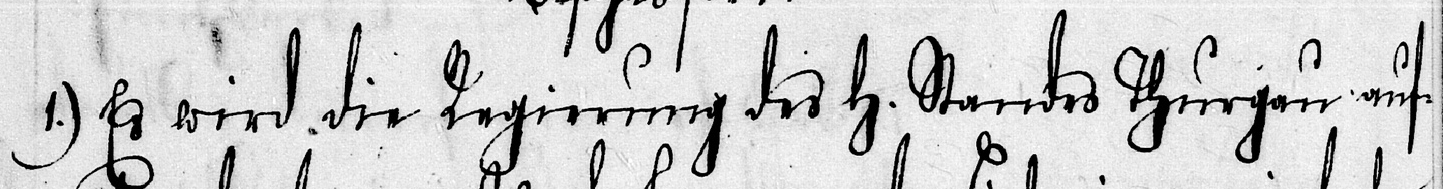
1.) Es wird die Regierung des H. Standes Thurgau auf¬
